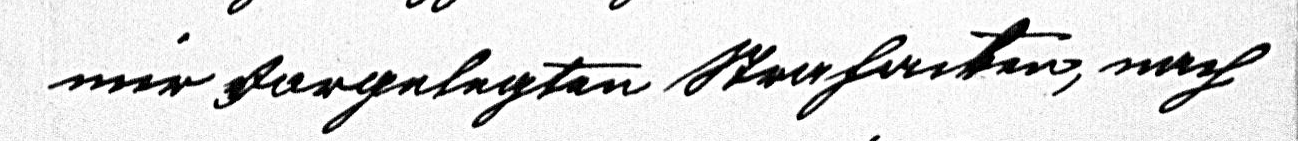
mir vorgelegten Strafarten, nach
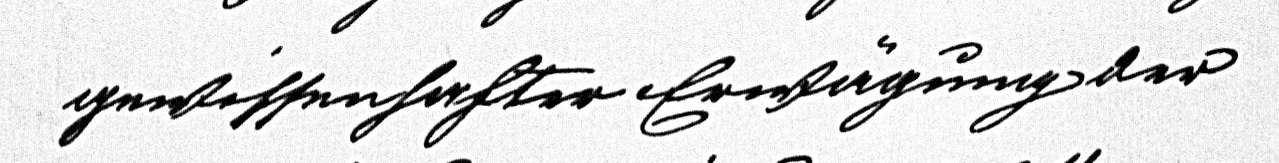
gewissenhafter Erwägung der
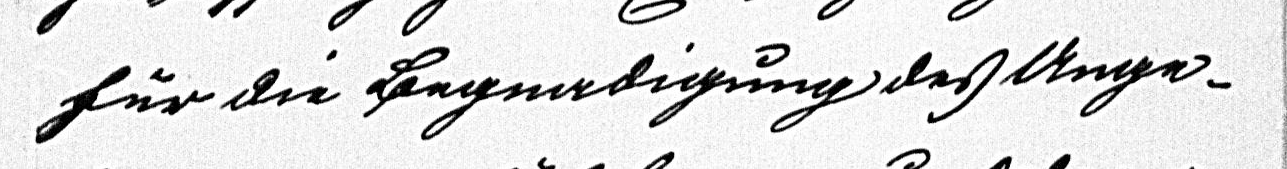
für die Begnadigung des Ange¬
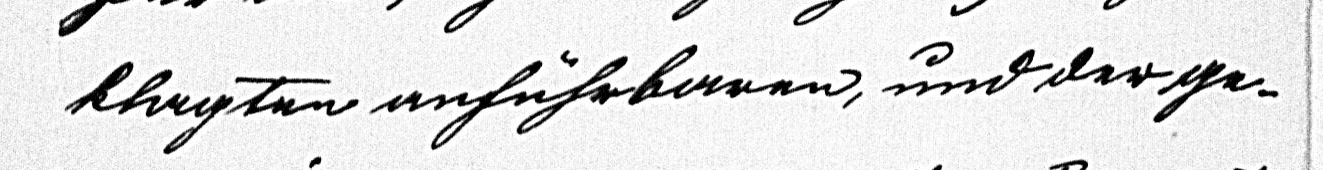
klagten anführbaren, und der ge¬
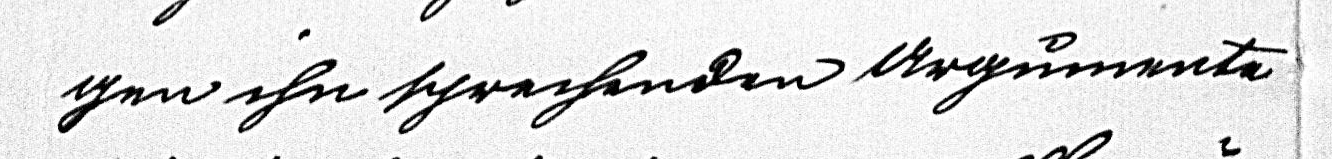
gen ihn schrechenden Argumente
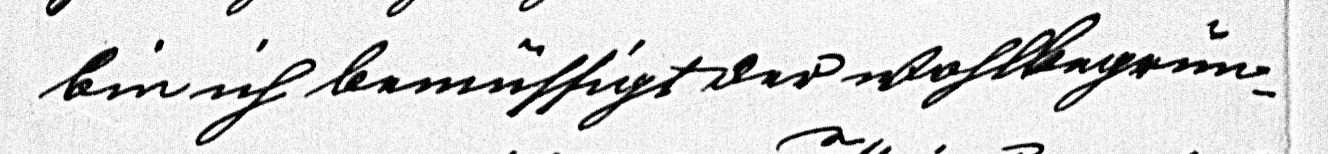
bin ich bemüssigt der Wohlbegrün¬
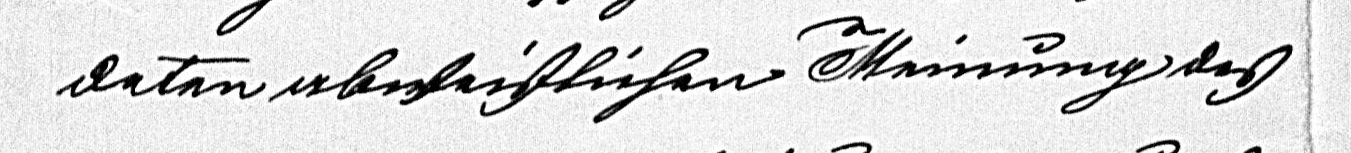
deten abweislichen Meinung des
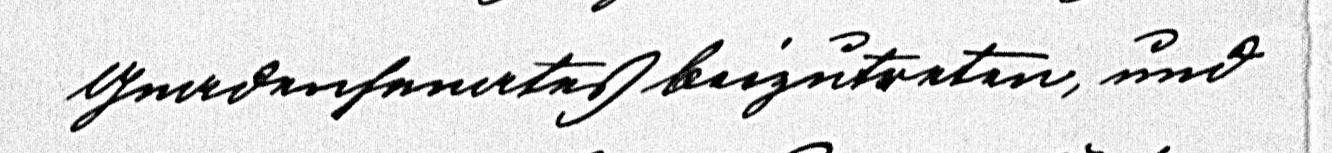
Gnadensenates beizutreten, und
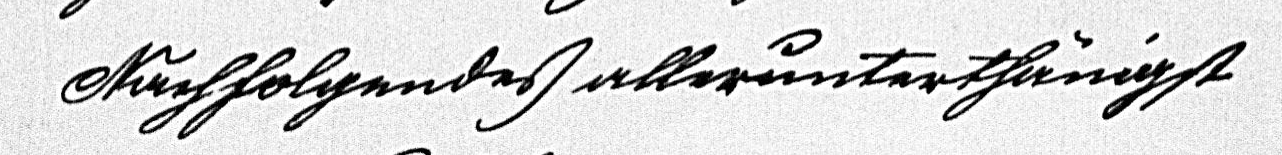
Nachfolgendes allerunterthänigst
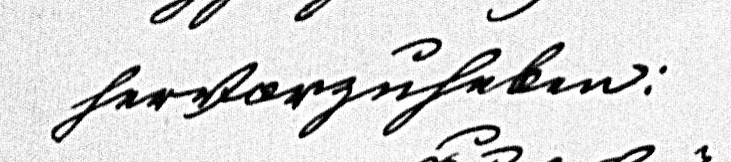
hervorzuheben:
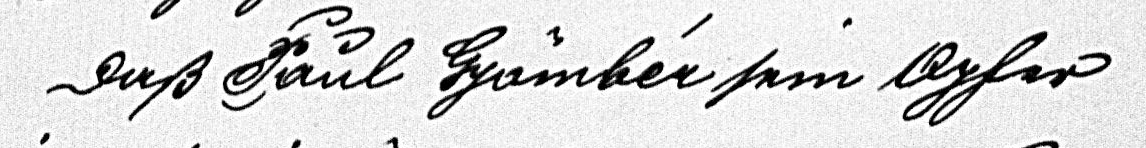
Daß Paul Gyömbér sein Opfer
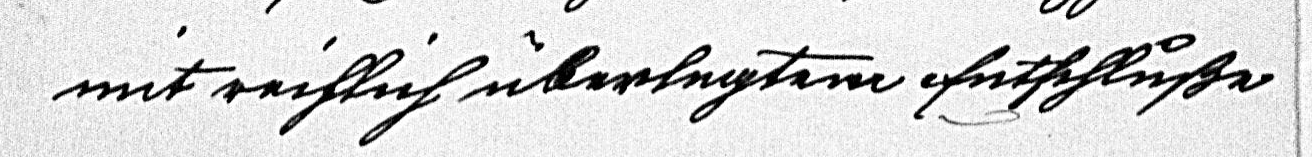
mit reiflich überlegtem Entschluße
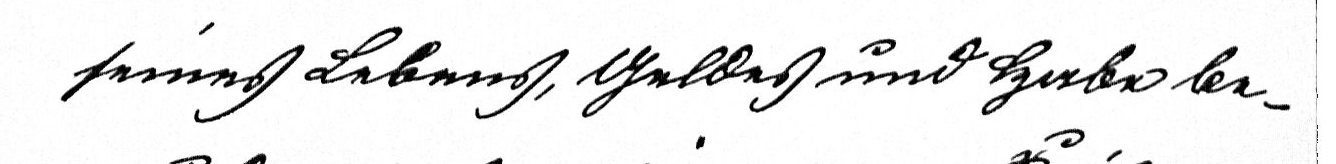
seines Lebens, Geldes und Habe be¬
